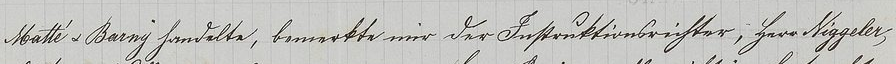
Matté & Barny handelte, bemerkte mir der Instruktionsrichter, Herr Niggeler,
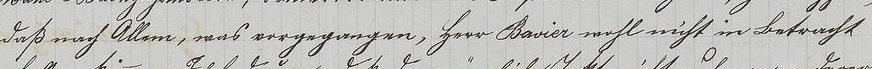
daß nach Allem, was vorgegangen, HerrBavier wohl nicht in Betracht
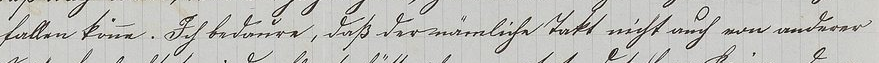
fallen könne. Ich bedaure, daß der nämliche Takt nicht auch von anderer
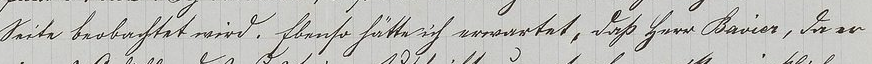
Seite beobachtet wird. Ebenso hätte ich erwartet, daß Herr Bavier, da er
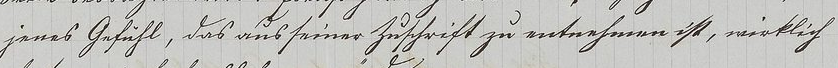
jenes Gefühl, das aus seiner Zuschrift zu entnehmen ist, wirklich
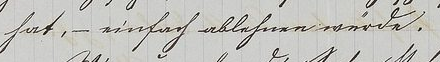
hat, – einfach ablehnen würde.
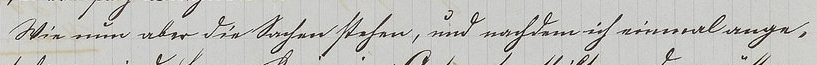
Wie nun aber die Sachen stehen, und nachdem ich einmal ange-
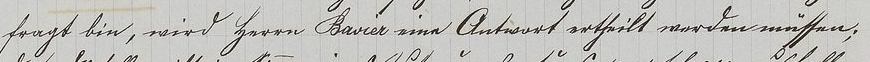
fragt bin, wird Herrn Bavier eine Antwort ertheilt werden müssen;
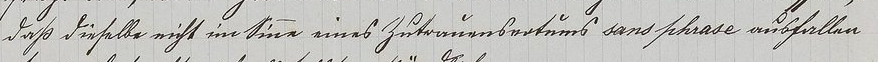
daß dieselbe nicht im Sinne eines Zutrauensvotums sans phrase ausfallen
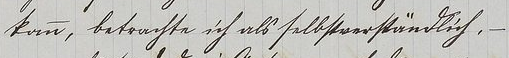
kann, betrachte ich als selbstverständlich. –
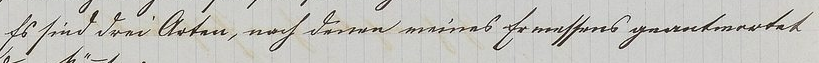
Es sind drei Arten, nach denen meines Ermessens geantwortet
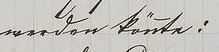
werden könnte:
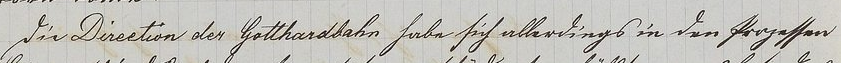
Die Direction der Gotthardbahn habe sich allerdings in den Prozessen
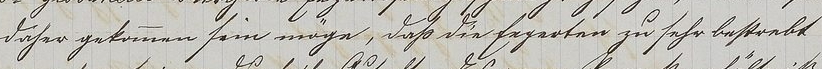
daher gekommen sein möge, daß die Experten zu sehr bestrebt
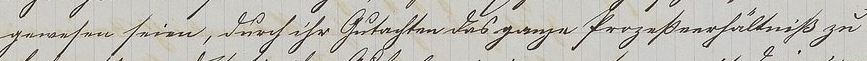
gewesen seien, durch ihr Gutachten das ganze Prozeßverhältniß zu
